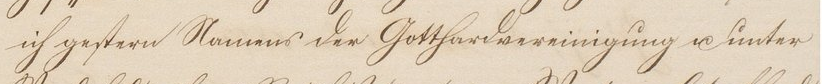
ich gestern Namens der Gotthardvereinigung & unter
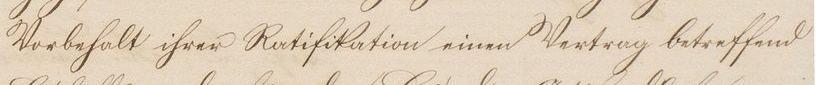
Vorbehalt ihrer Ratifikation einen Vertrag betreffend
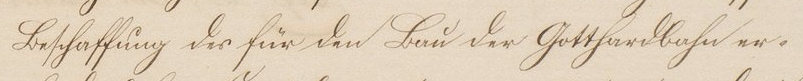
Beschaffung des für den Bau der Gotthardbahn er-
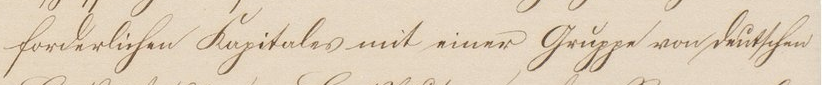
forderlichen Kapitales mit einer Gruppe von Deutschen
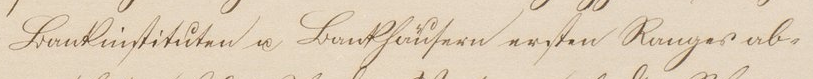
Bankinstituten & Bankhäusern ersten Ranges ab-
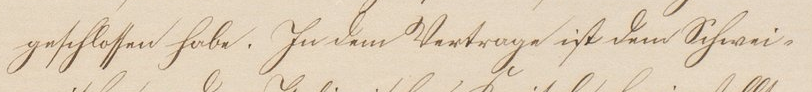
geschlossen habe. In dem Vertrage ist dem Schwei-
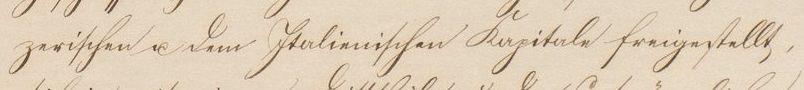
zerischen & dem Italienischen Kapitale freigestellt,
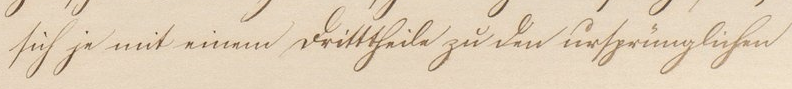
sich je mit einem Dritttheile zu den ursprünglichen
